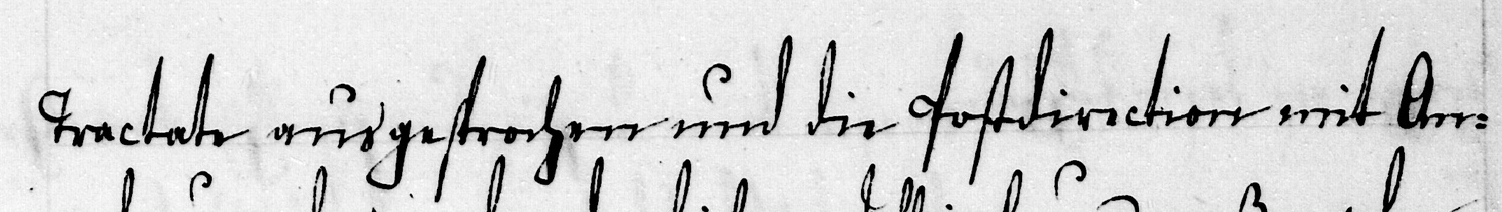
Tractate ausgesprochen und die Postdirection mit An¬
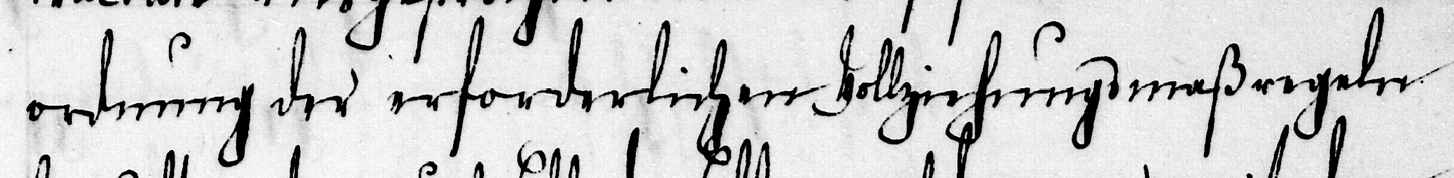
ordnung der erforderlichen Vollziehungsmaßregeln
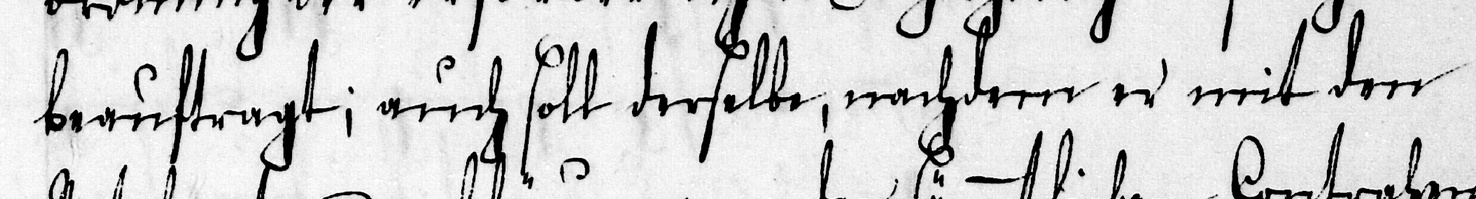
beauftragt; auch soll derselbe, nachdem er mit den
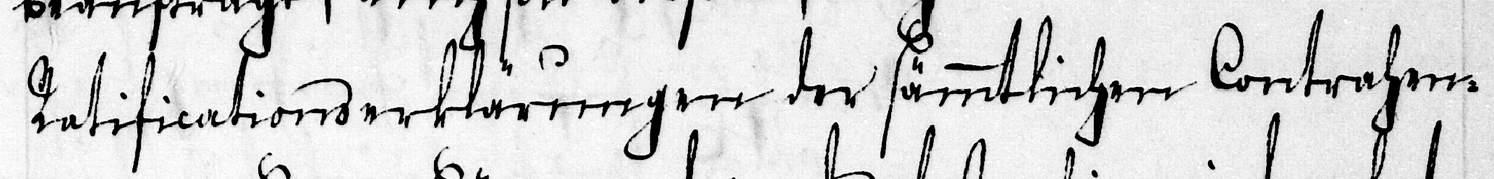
Ratificationserklärungen der sämmtlichen Contrahen¬
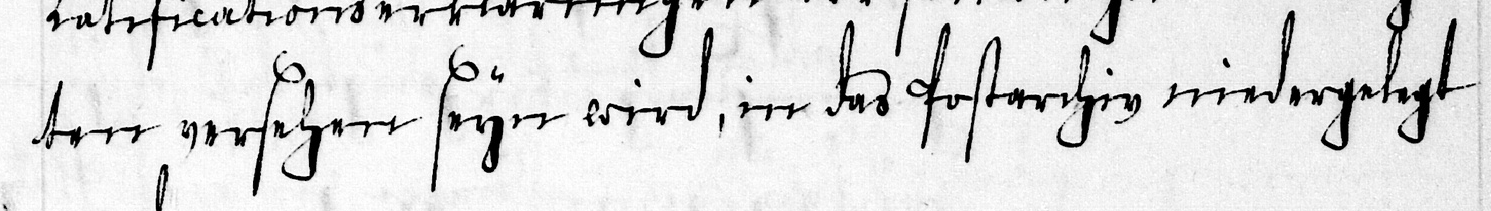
ten versehen seyn wird, in das Postarchiv niedergelegt
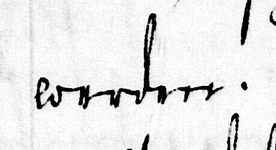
werden.
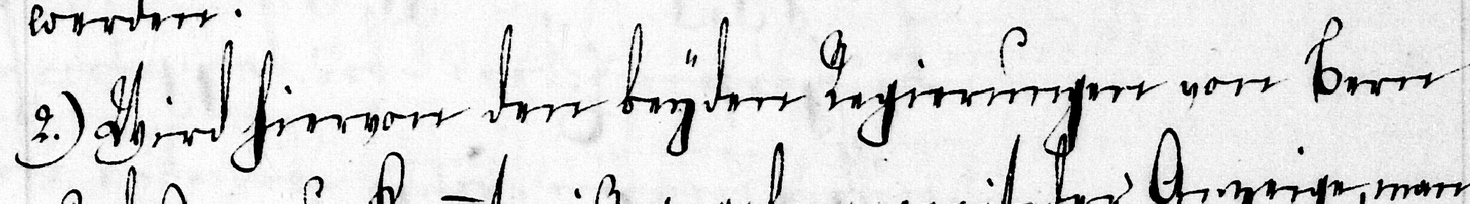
2.) Wird hiervon den beyden Regierungen von Bern
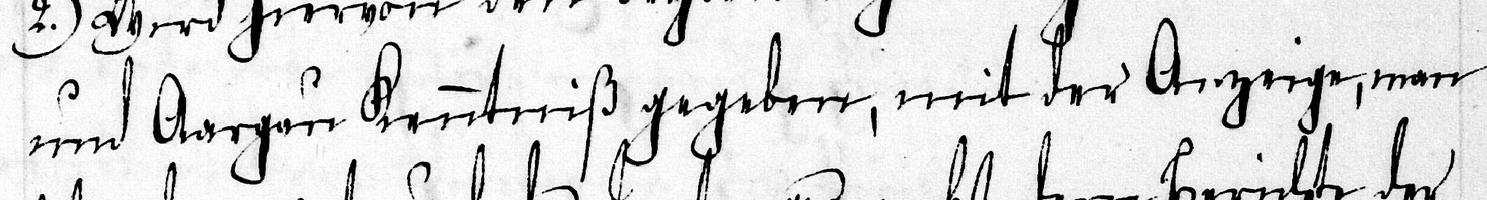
und Aargau Kenntniß gegeben, mit der Anzeige, man
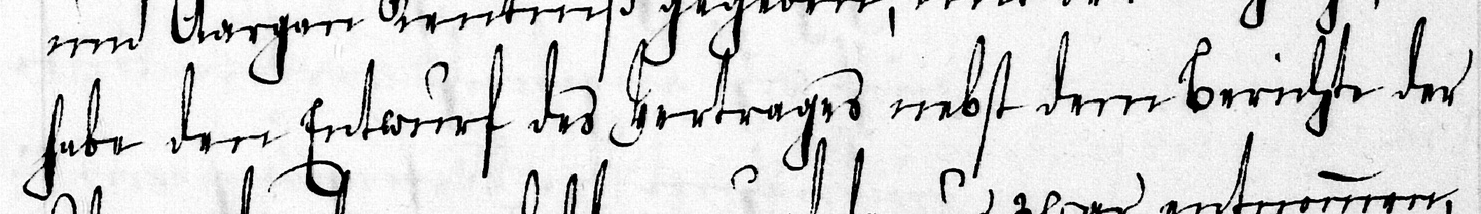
habe den Entwurf des Vertrages nebst dem Berichte der
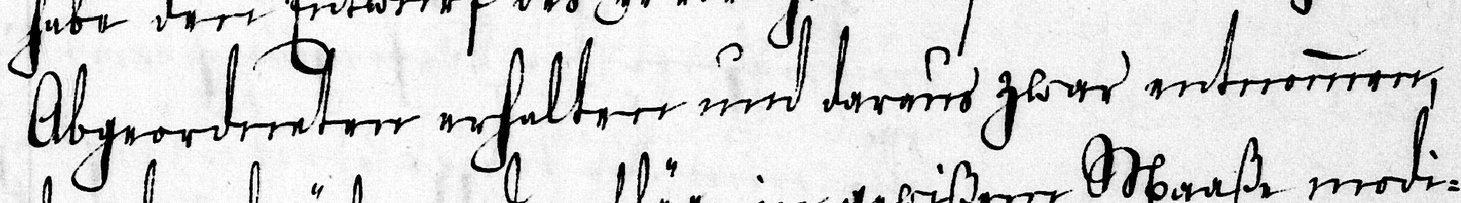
Abgeordneten erhalten und daraus zwar entnommen,
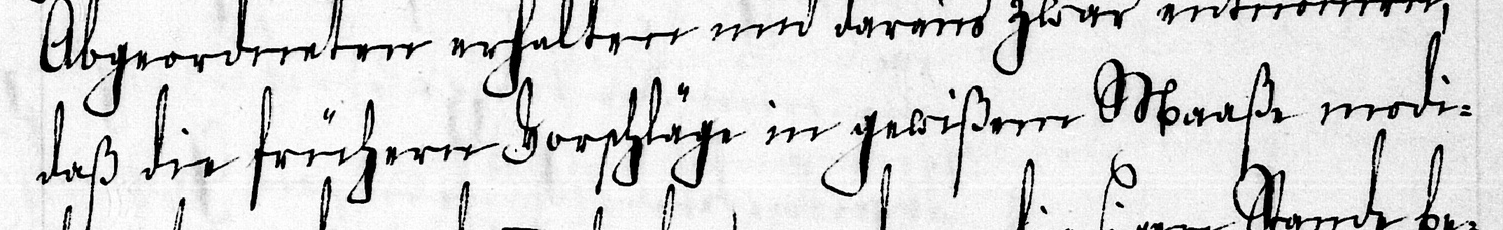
daß die frühern Vorschläge in gewißem Maaße modi¬
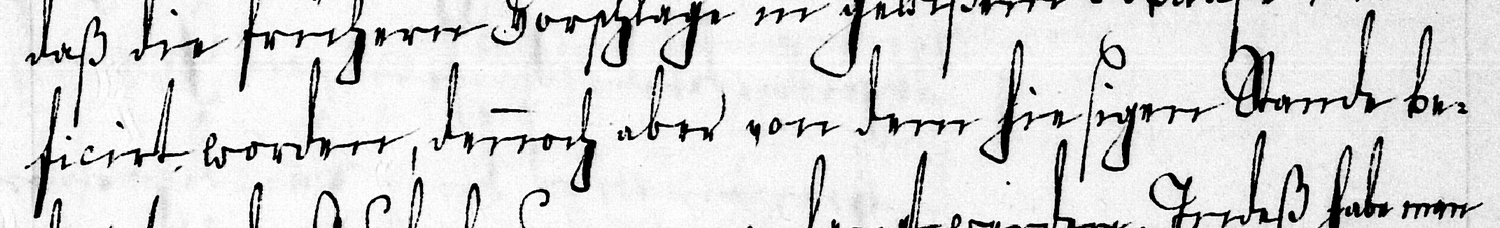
ficirt worden, dennoch aber von dem hiesigen Stande be¬
